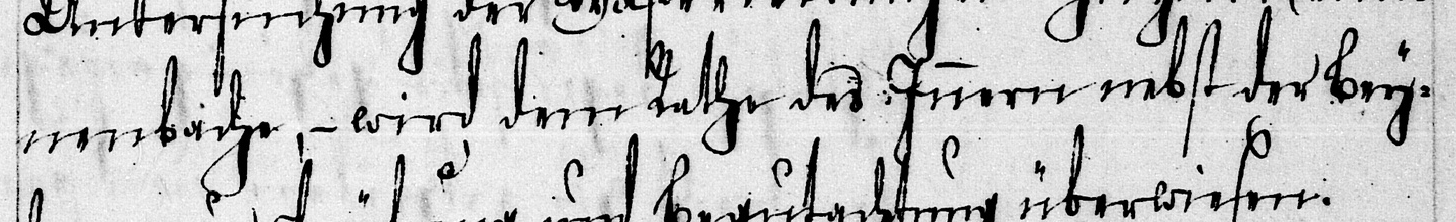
nenbache, – wird dem Rathe des Innern nebst der Bey¬
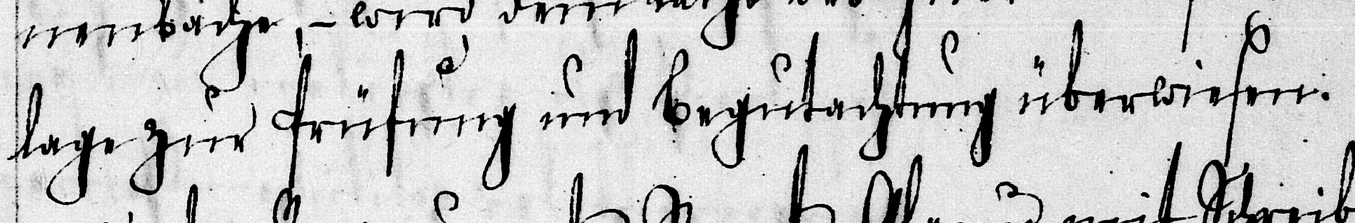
lage zur Prüfung und Begutachtung überwiesen.
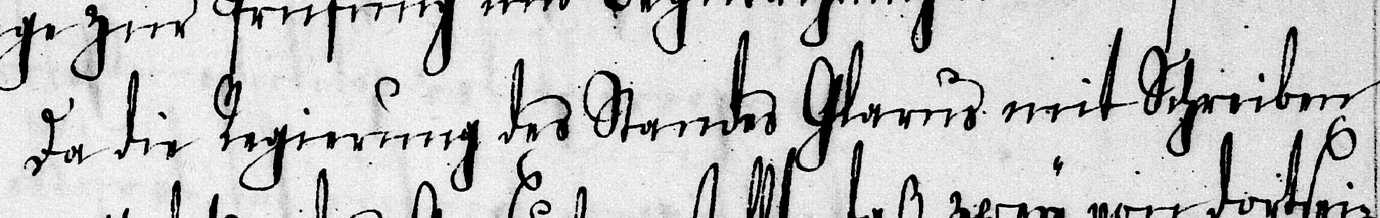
Da die Regierung des Standes Glarus mit Schreiben
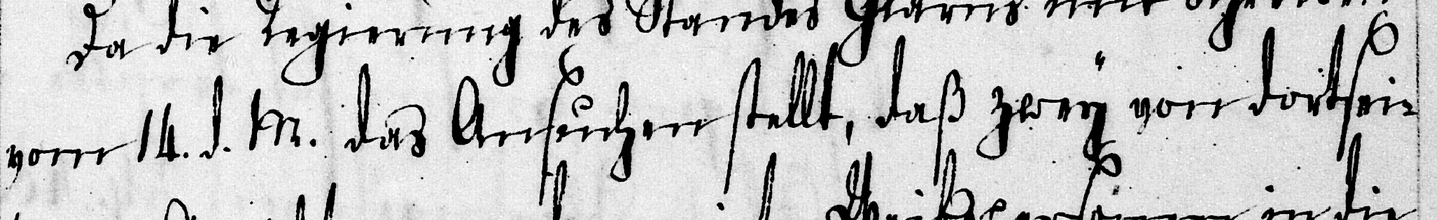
vom 14. d. M. das Ansuchen stellt, daß zwey von dortsei¬
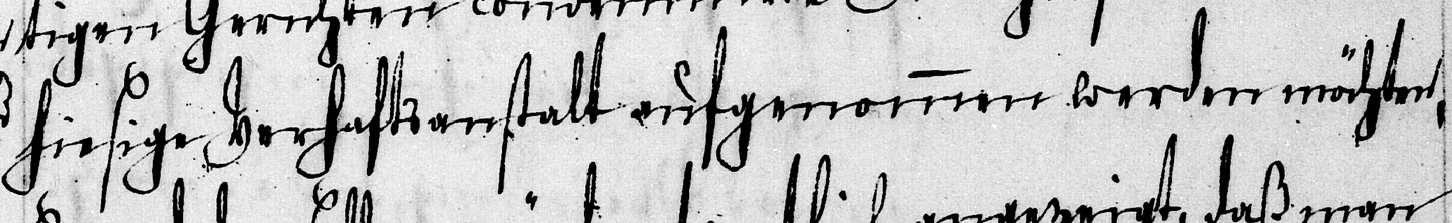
hiesige Verhaftsanstalt aufgenommen werden möchten,
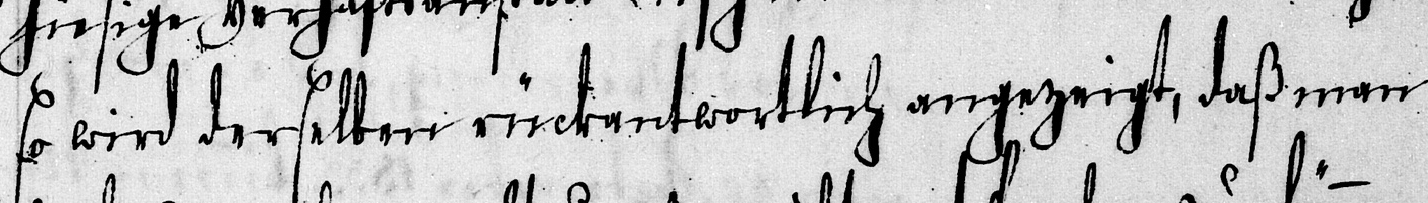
so wird derselben rückantwortlich angezeigt, daß man
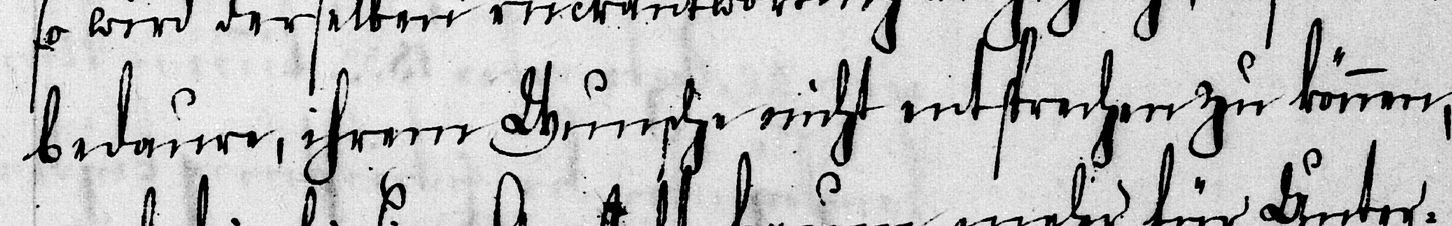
bedaure, ihrem Wunsche nicht entsprechen zu können,
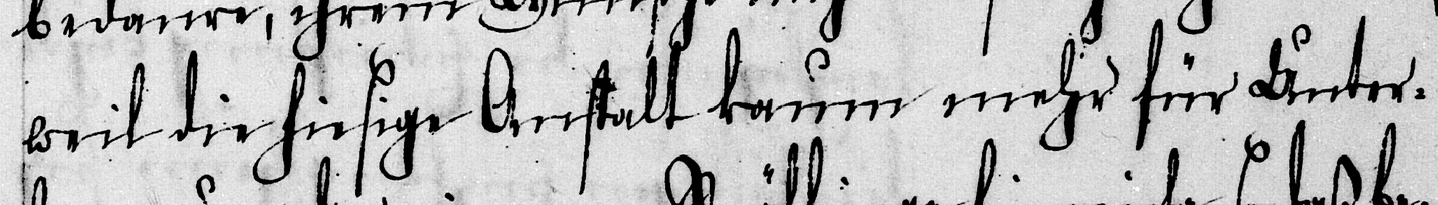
weil die hiesige Anstalt kaum mehr für Unter¬
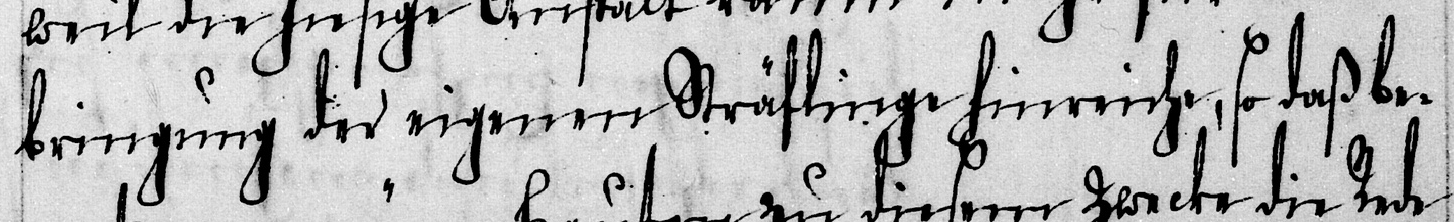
bringung der eigenen Sträflinge hinreiche, so daß be¬
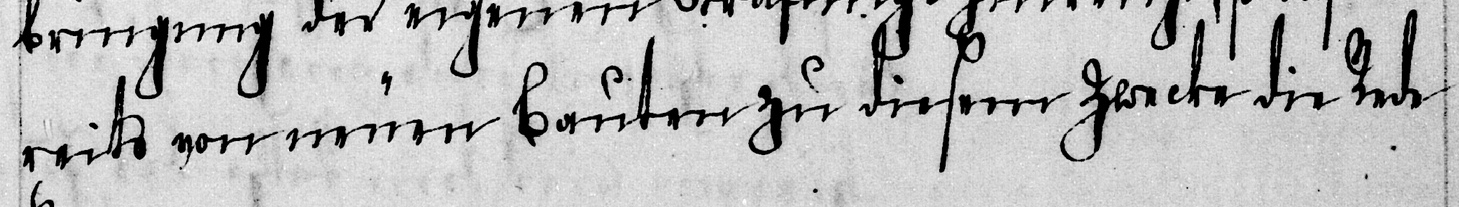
reits von neuen Bauten zu diesem Zwecke die Rede
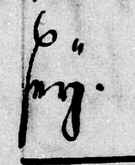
sey.
